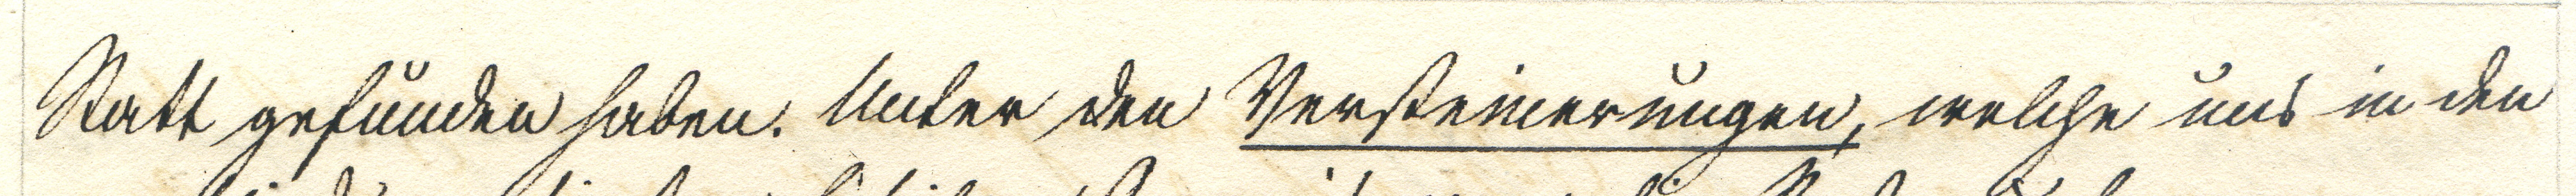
Statt gefunden haben. Unter den Versteinerungen, welche uns in den
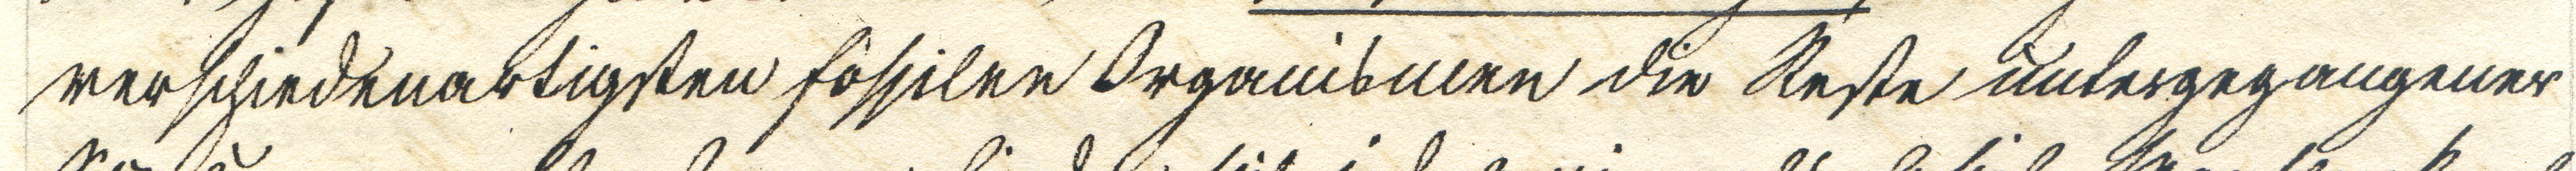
verschiedenartigsten fossilen Organismen die Reste untergegangener
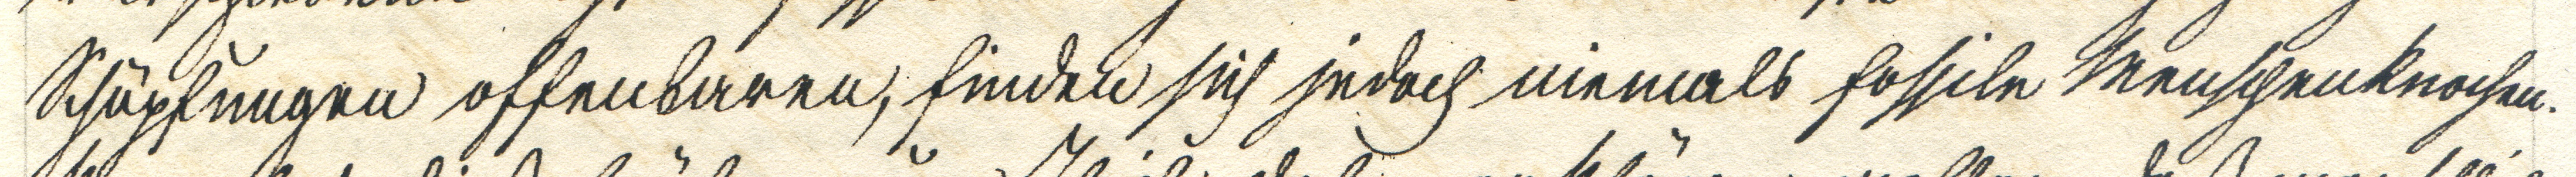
Schöpfungen offenbaren, finden sich jedoch niemals fossile Menschenknochen.
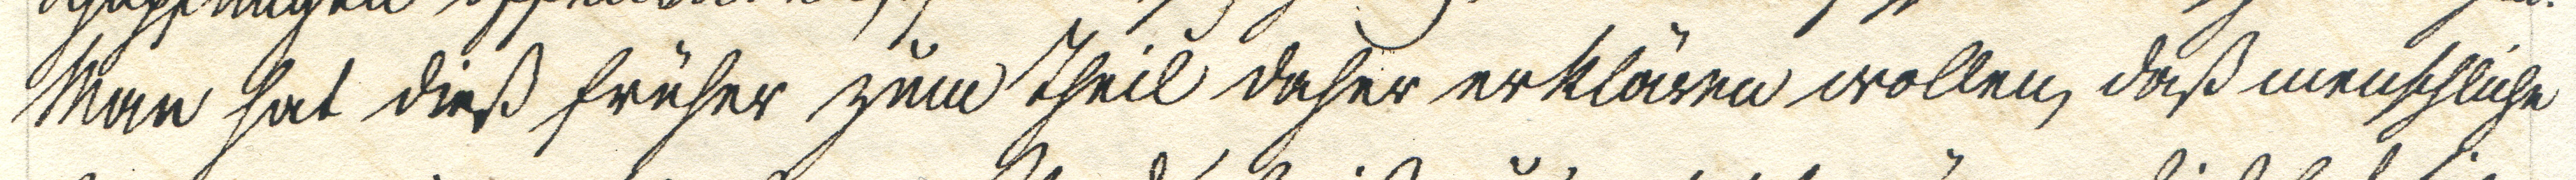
Man hat dieß früher zum Theil daher erklären wollen, daß menschliche
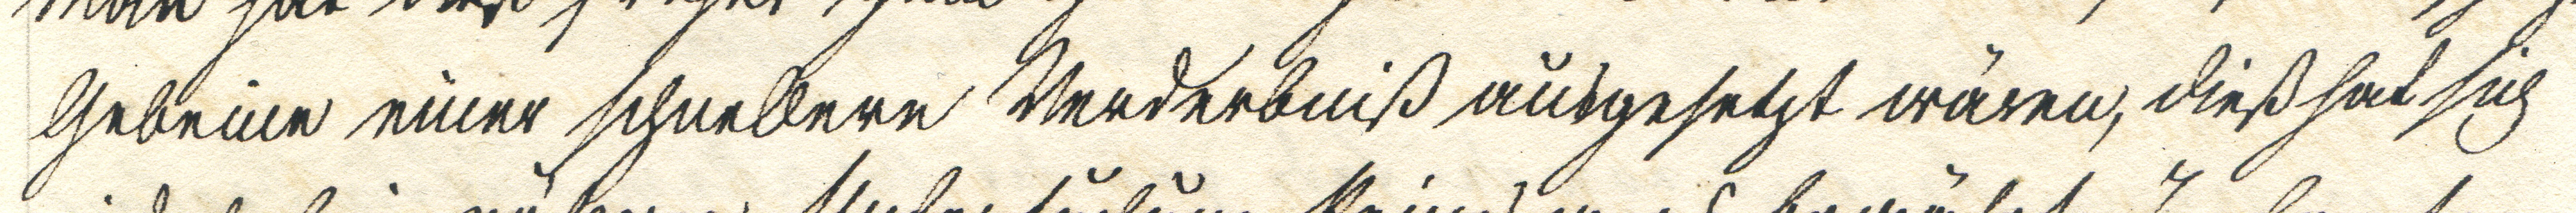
Gebeine einer schnellern Verderbniß ausgesetzt wären, dieß hat sich
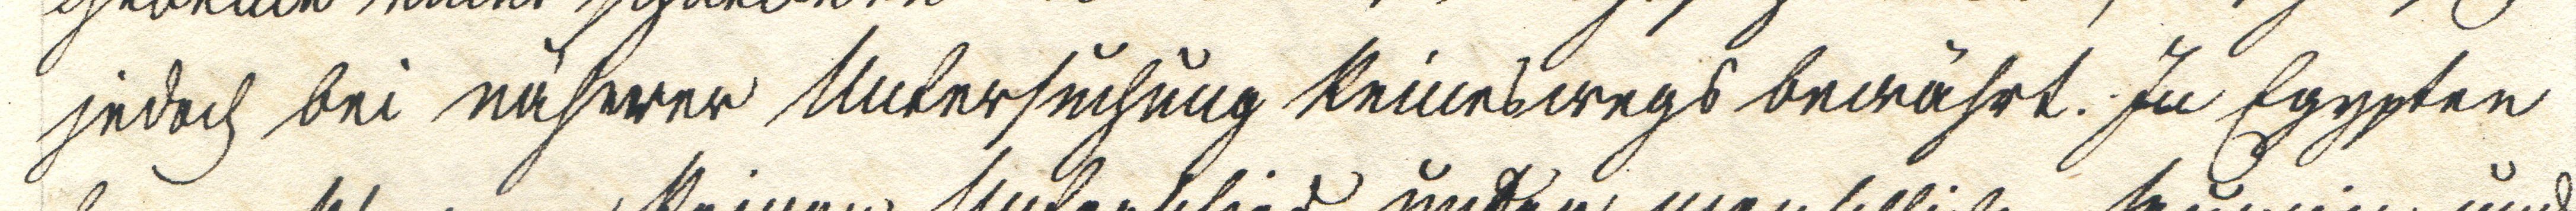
jedoch bei näherer Untersuchung keineswegs bewährt. In Egypten
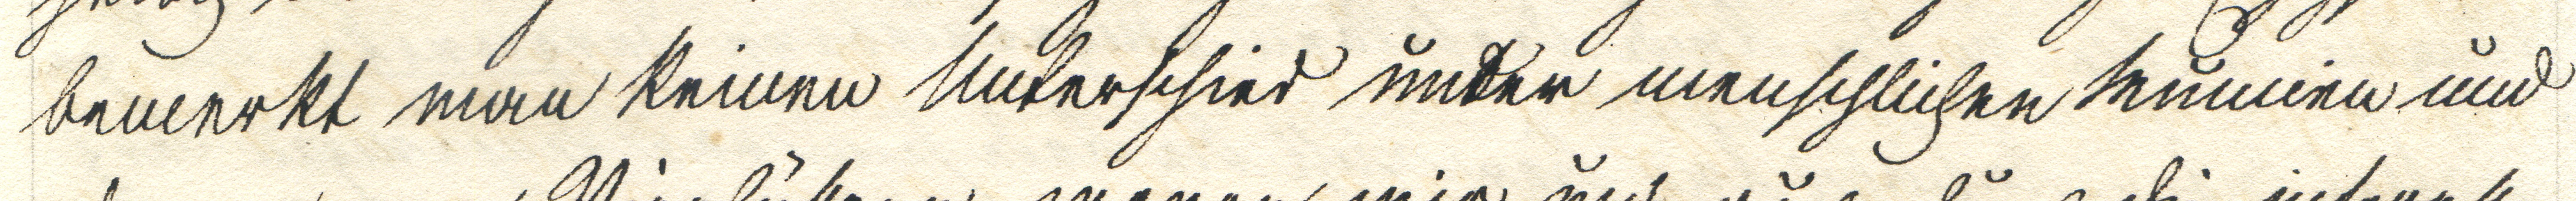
bemerkt man keinen Unterschied undter menschlichen Mumien und
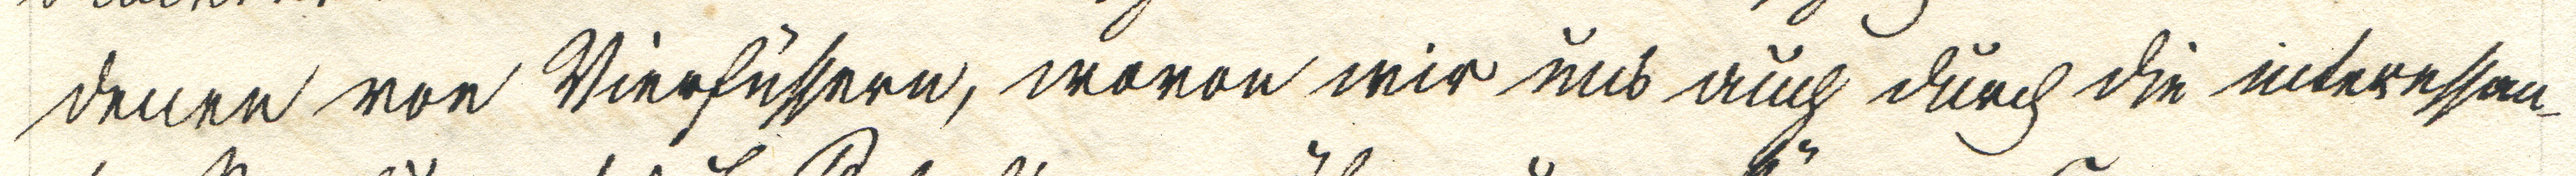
denen von Vierfüssern, wovon wir uns auch durch die interressan-
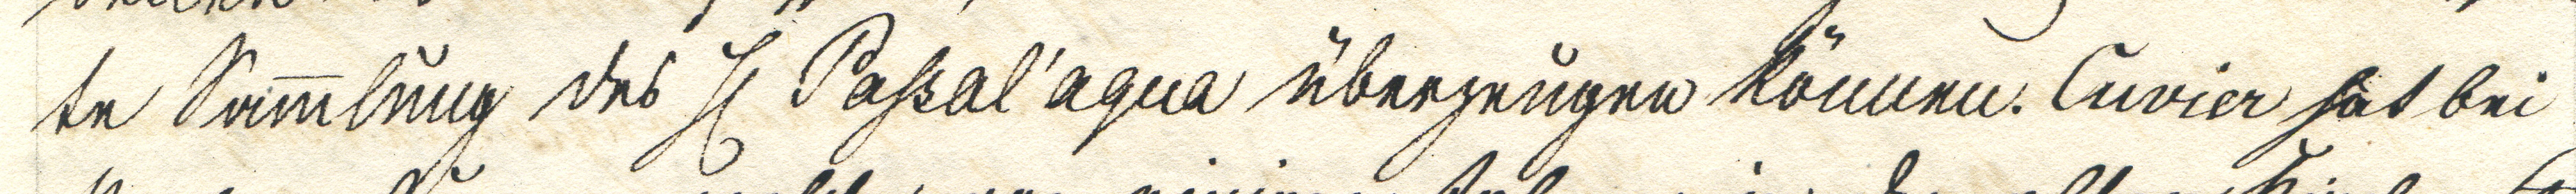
te Sam̃lung des H￼ Passal’aqua überzeugen können. Cuvier hat bei
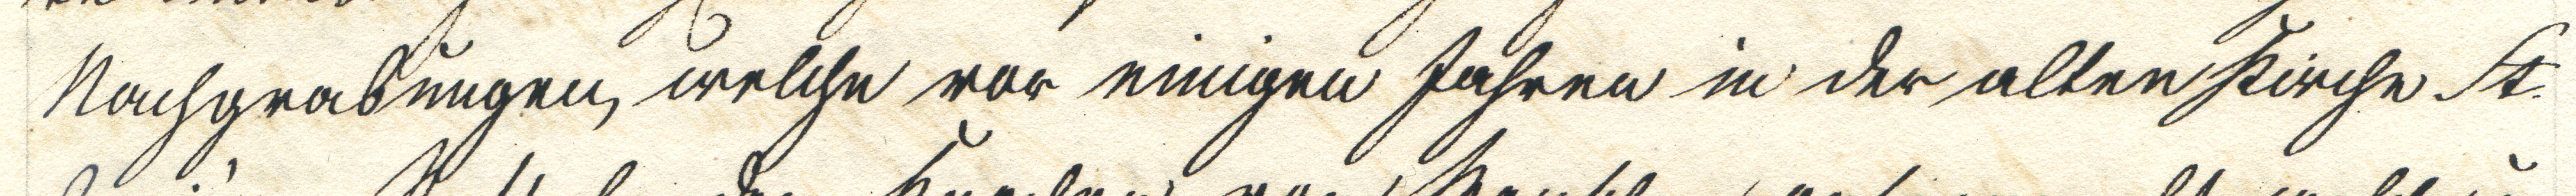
Nachgrabungen, welche vor einigen Jahren in der alten Kirche St.
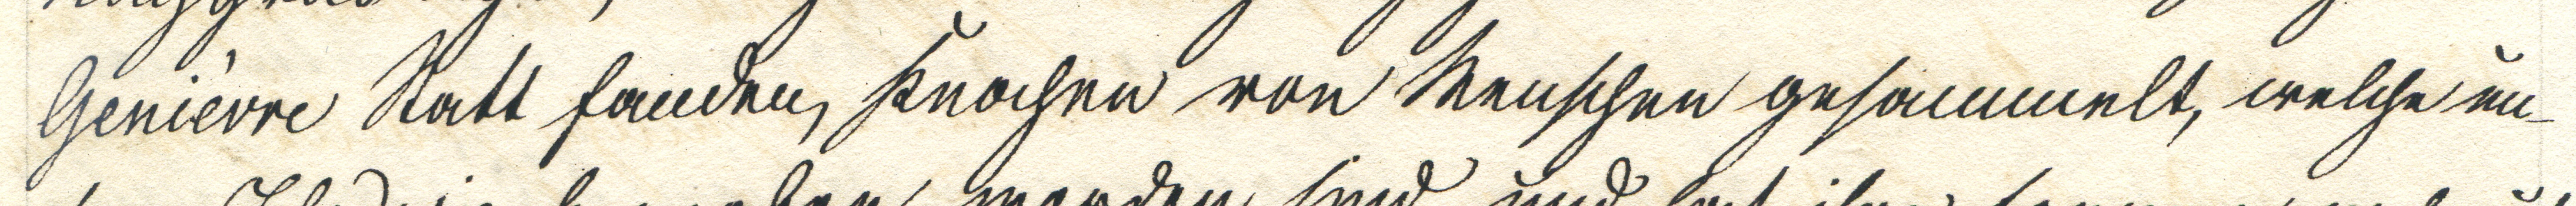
Genièvre Statt fanden, Knochen von Menschen gesammelt, welche un-
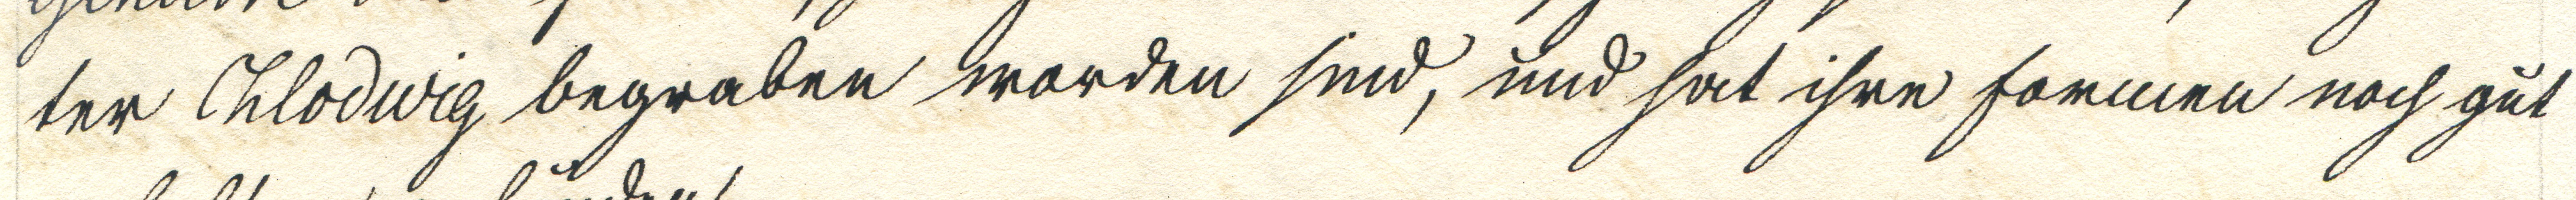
ter Chlodwig begraben worden sind, und hat ihre Formen noch gut
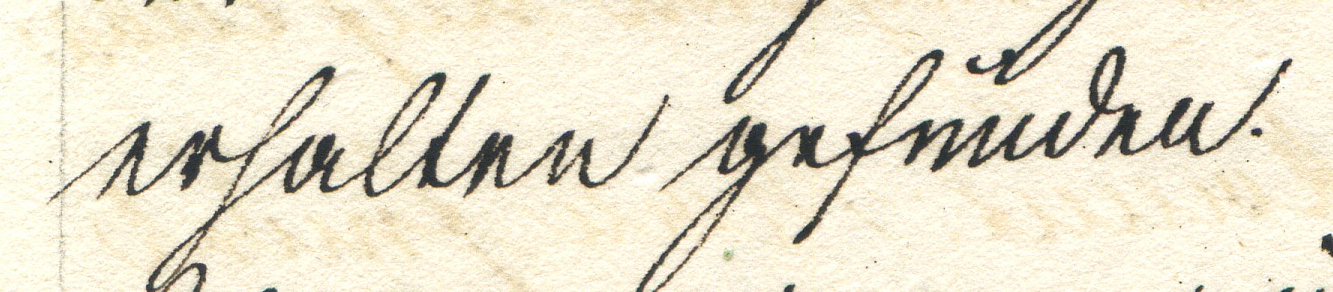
erhalten gefunden.
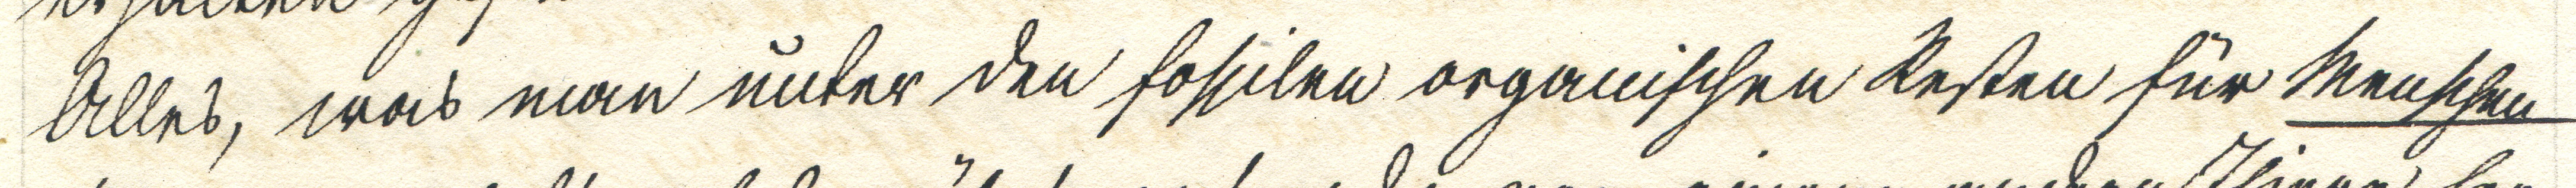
Alles, was man unter den fossilen organischen Resten für Menschen
